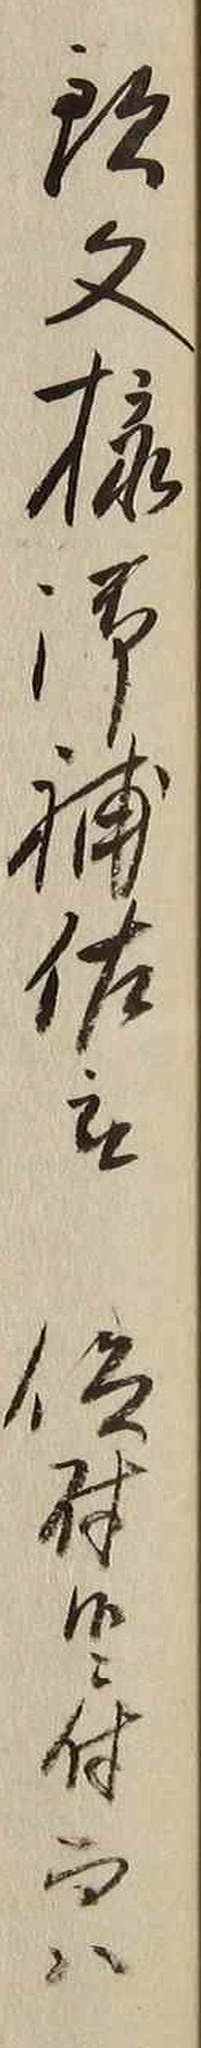欽文様御補佐被仰付候ニ付而ハ
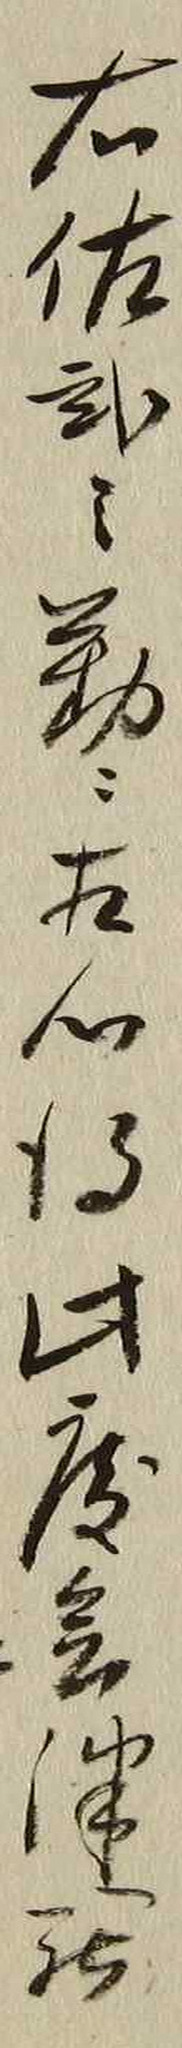右佐弐之勤ニ相心得此度会津へ罷
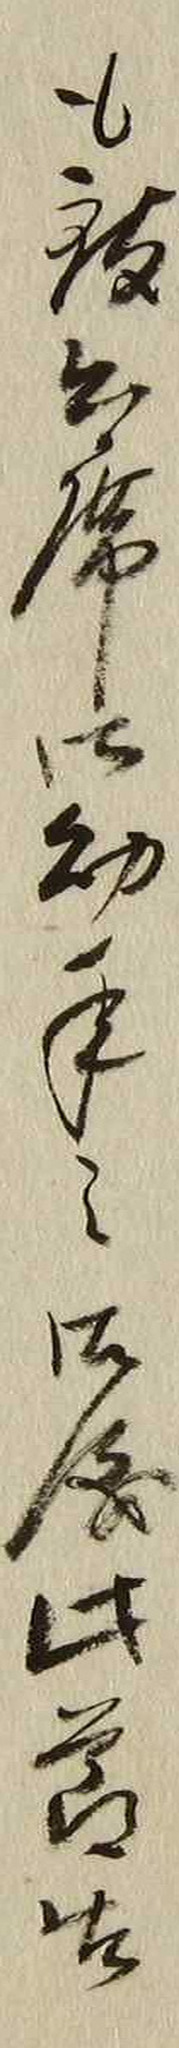も致出席御幼年之御儀此節御
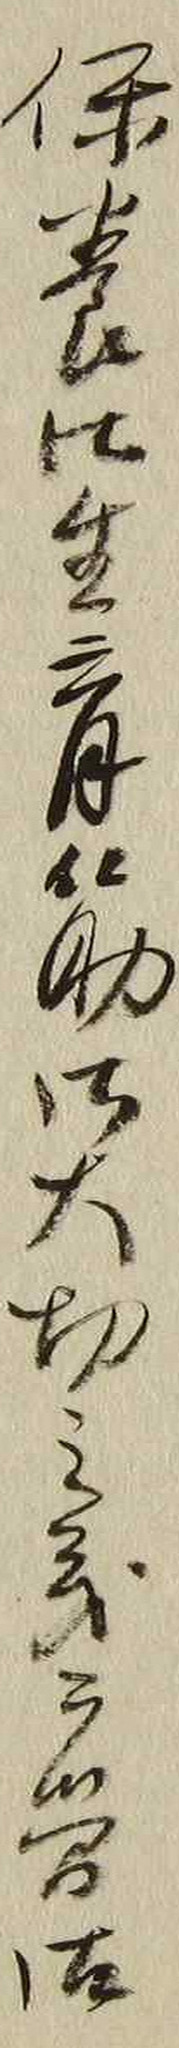保養御生育筋御大切之義ニ候間御
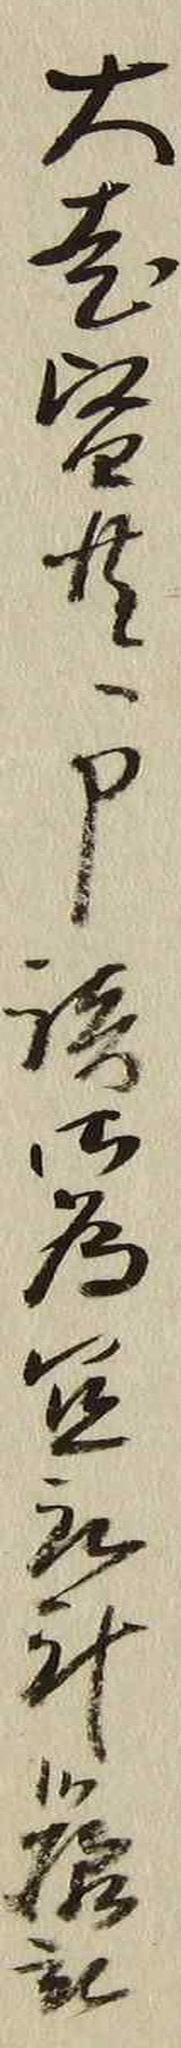大老皆共へ申談御為宜取計候様被
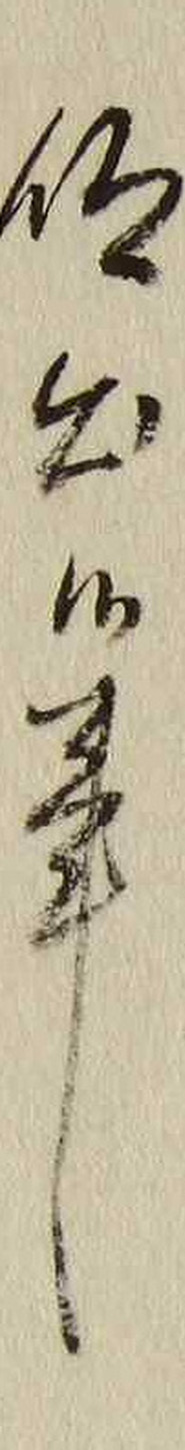仰出候事
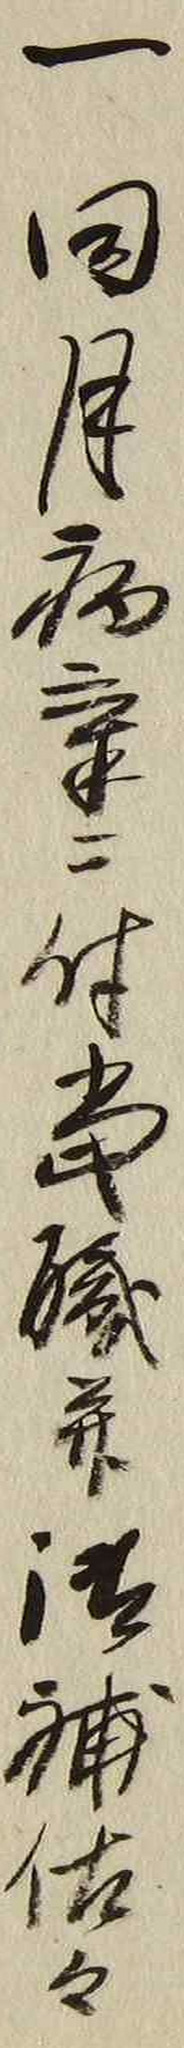一同月病気ニ付当職并御補佐々
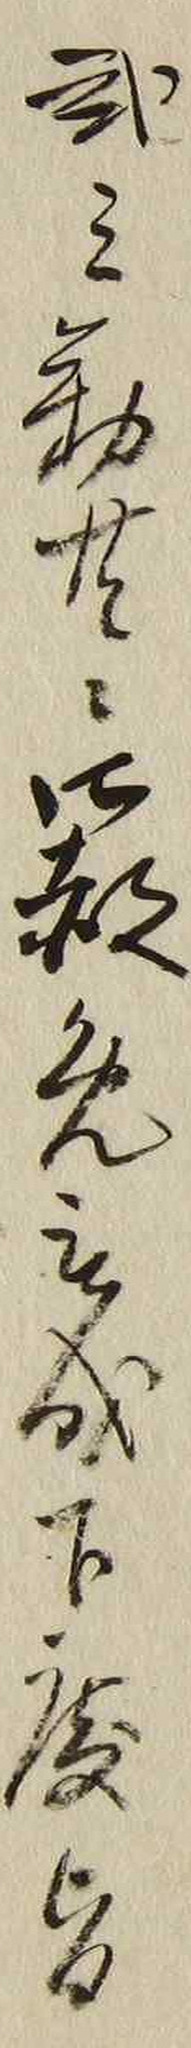弐之勤共ニ御赦免被成下度旨
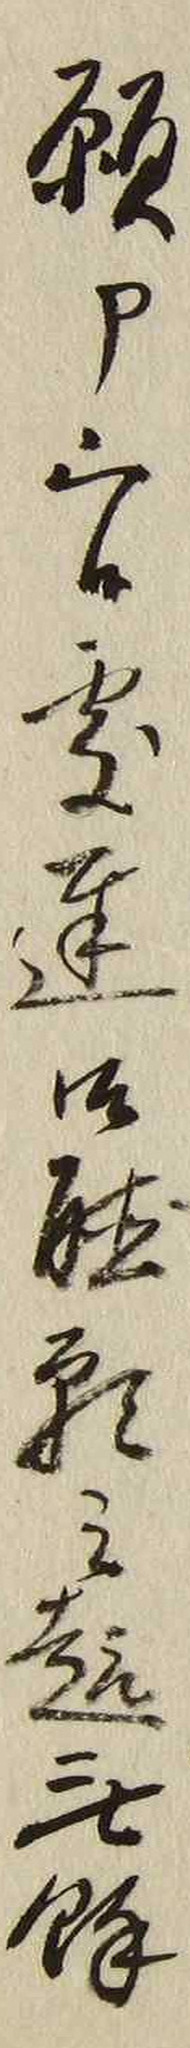願申上候処達御聴願之趣無余

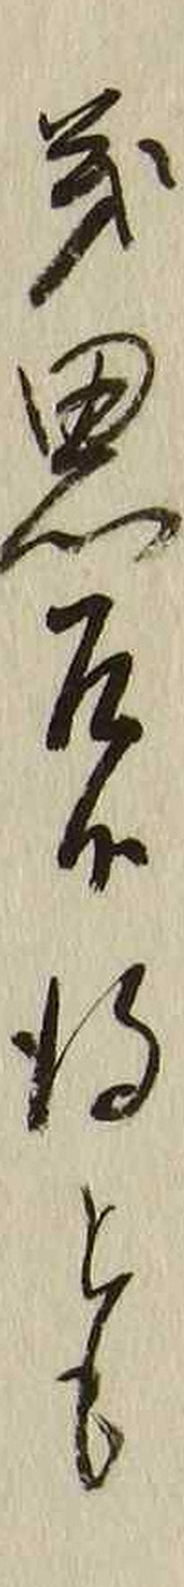義思召候得とも
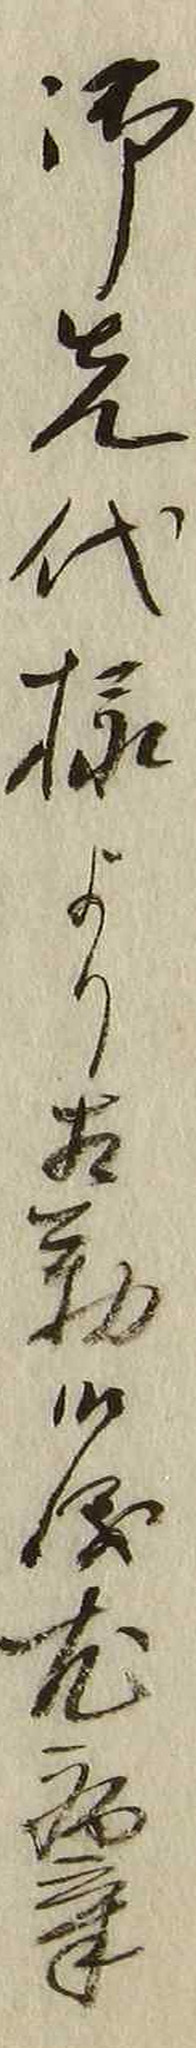御先代様より相勤候儀尤病気
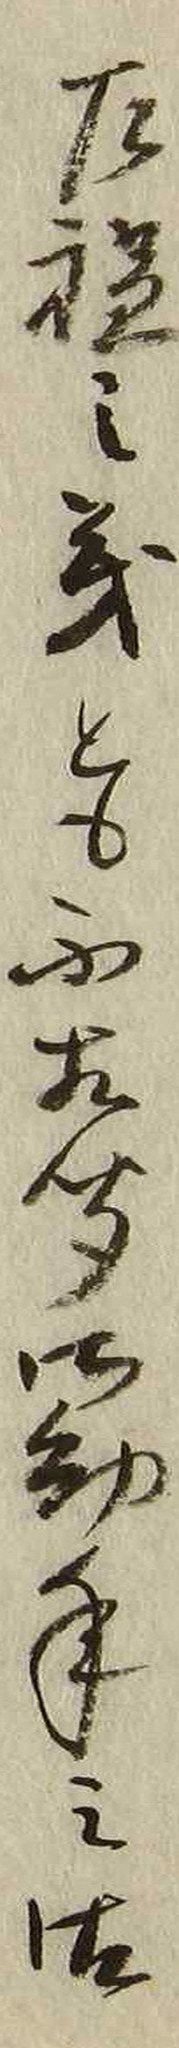左程之義とも不相聞御幼年之御
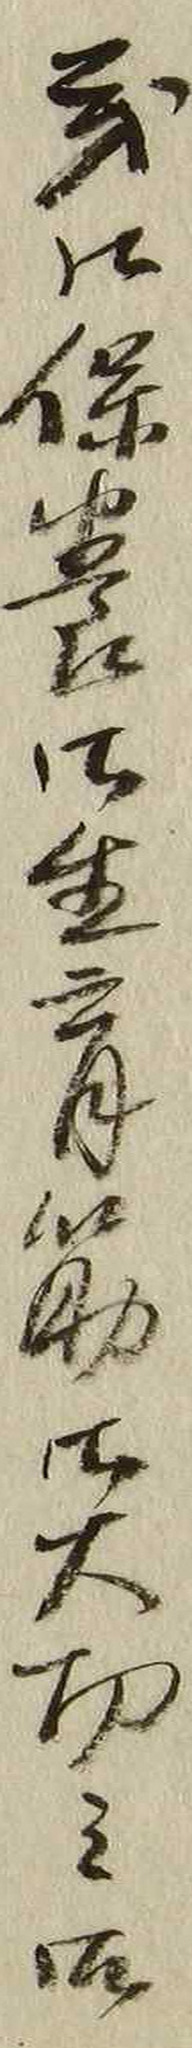義御保養御生育筋御大切之御
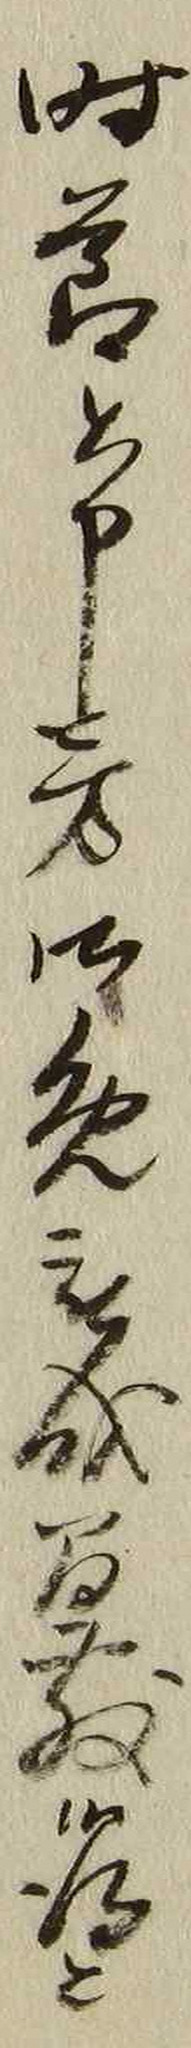時節と申旁御免被成間敷候得と
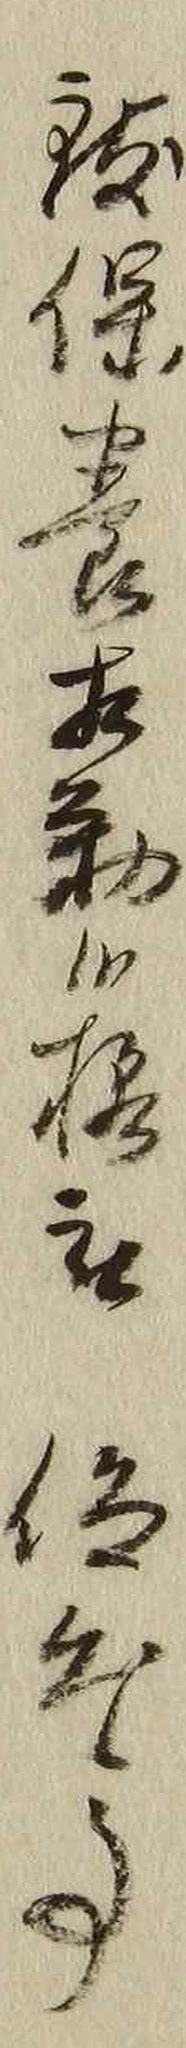致保養相勤候様被仰出候事
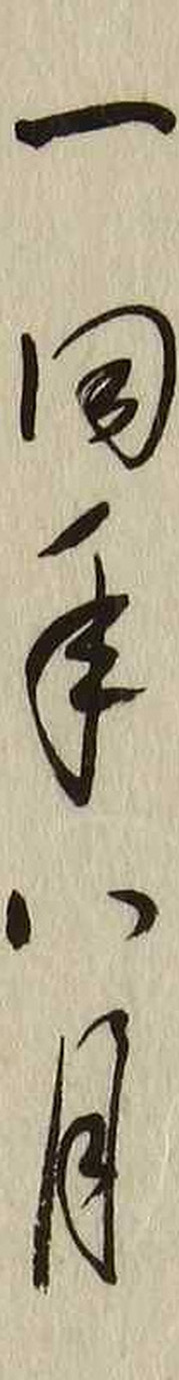一同年八月
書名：諸士系譜　巻之351　す之部1
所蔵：会津若松市立会津図書館
